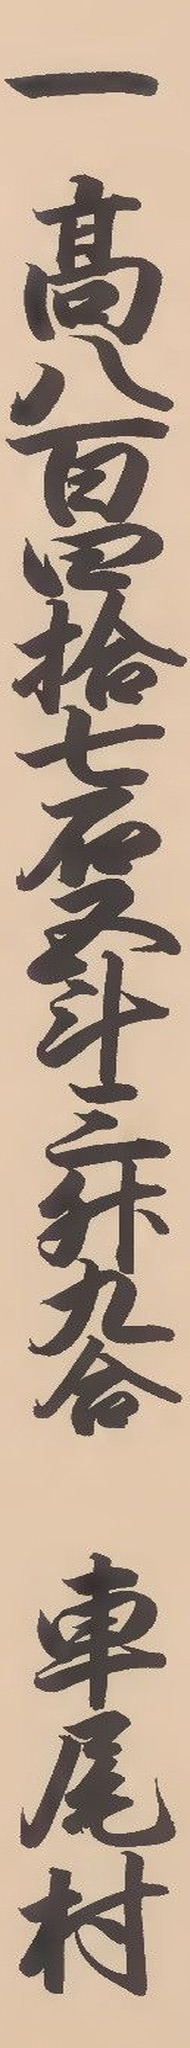一高八百四拾七石五斗三升九合車尾村
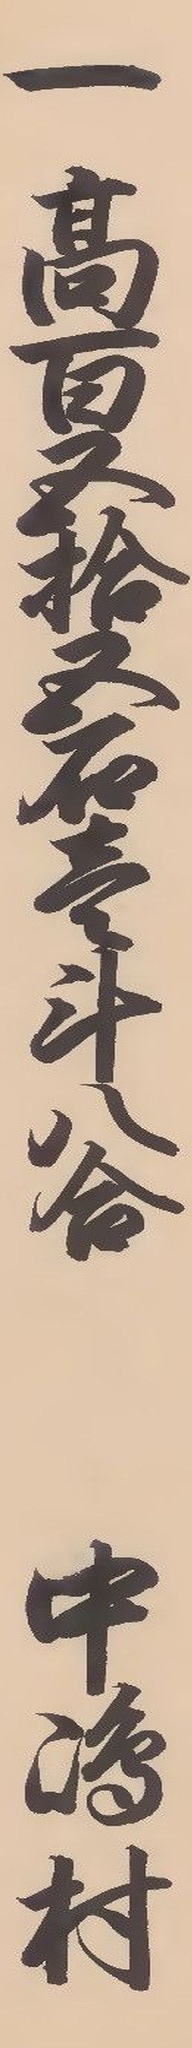一高百五拾五石壱斗八合中嶋村
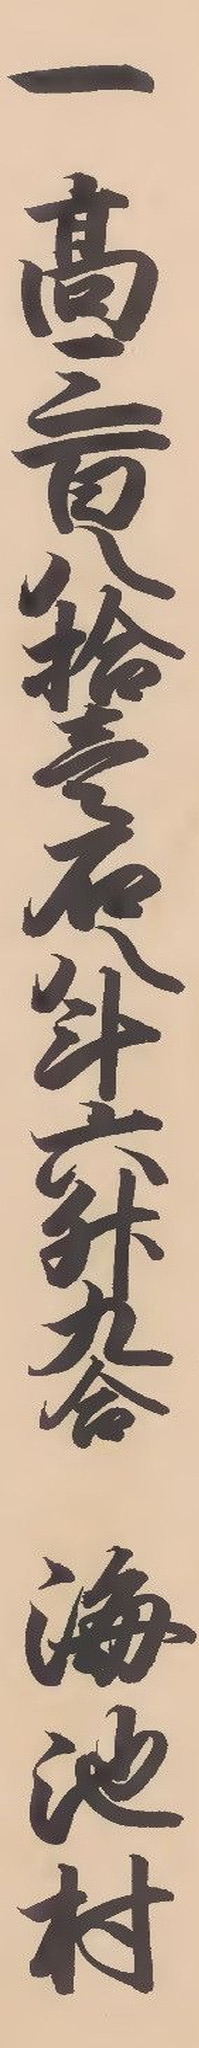一高三百八拾壱石八斗六升九合海池村

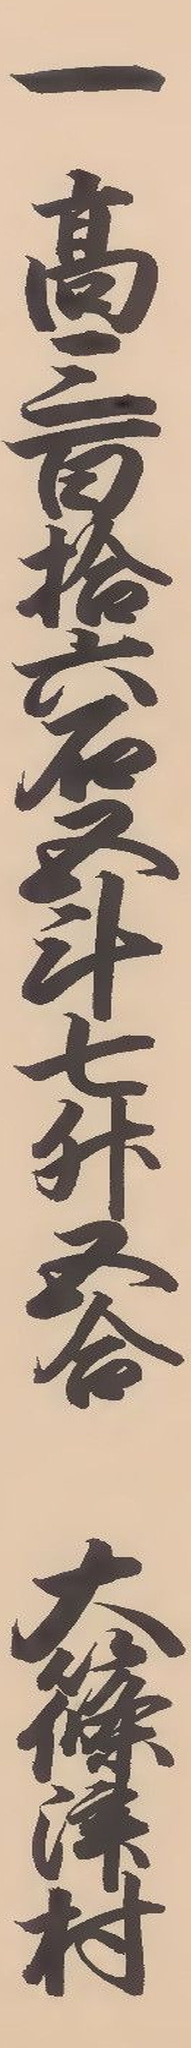一高三百拾六石五斗七升五合大篠津村

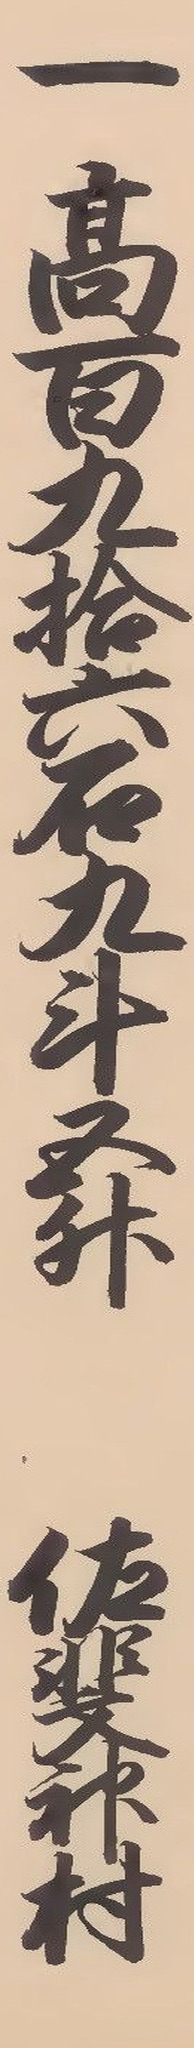一高百九拾六石九斗五升佐斐神村
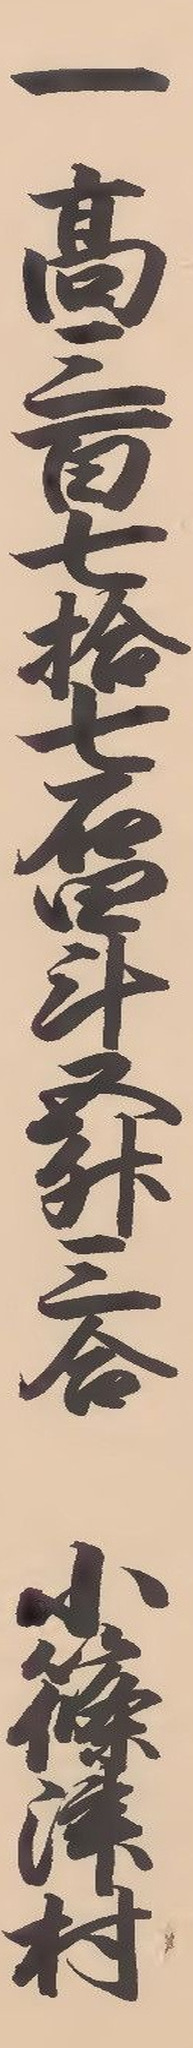一高三百七拾七石四斗五升三合小篠津村
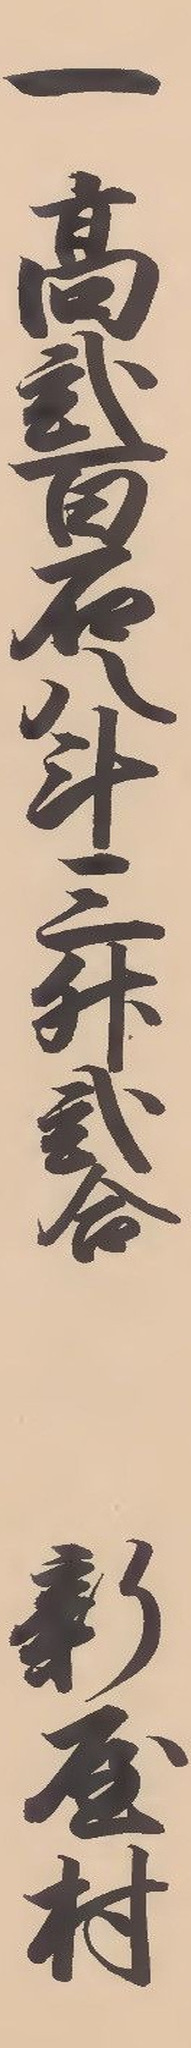一高弐百石八斗三升弐合新屋村
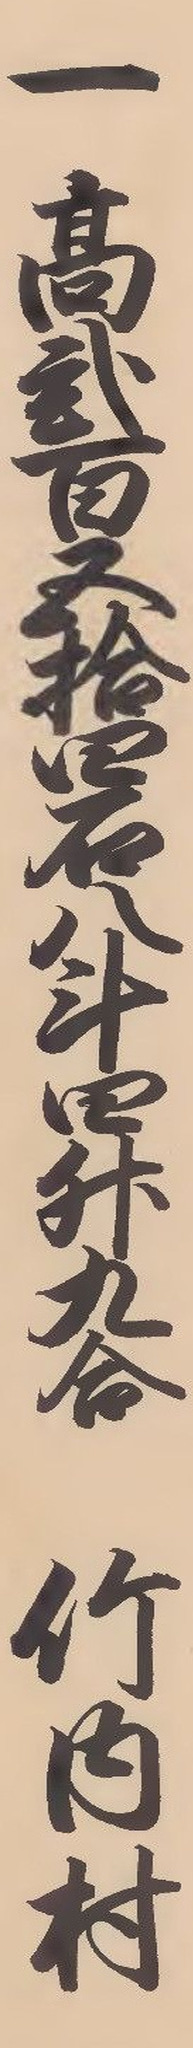一高弐百五拾四石八斗四升九合竹内村

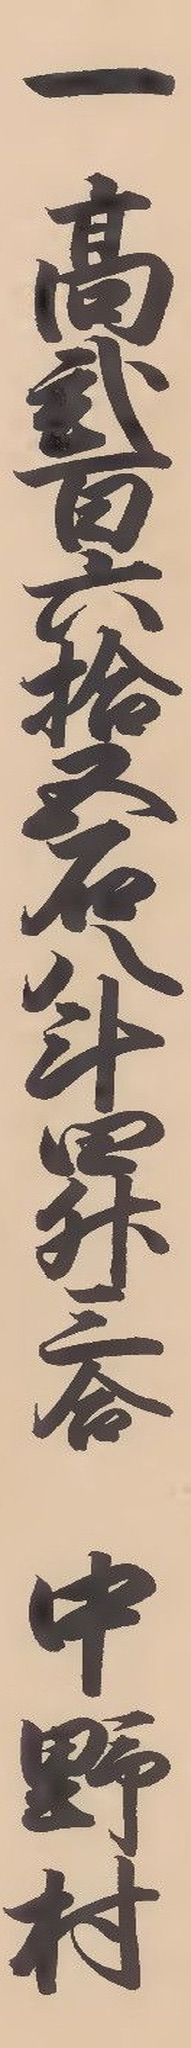一高弐百六拾五石八斗四升三合中野村
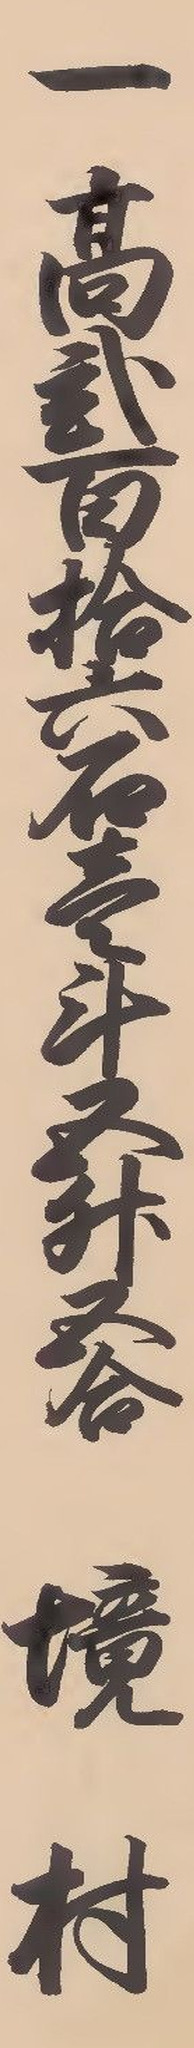一高弐百拾六石壱斗五升五合境村
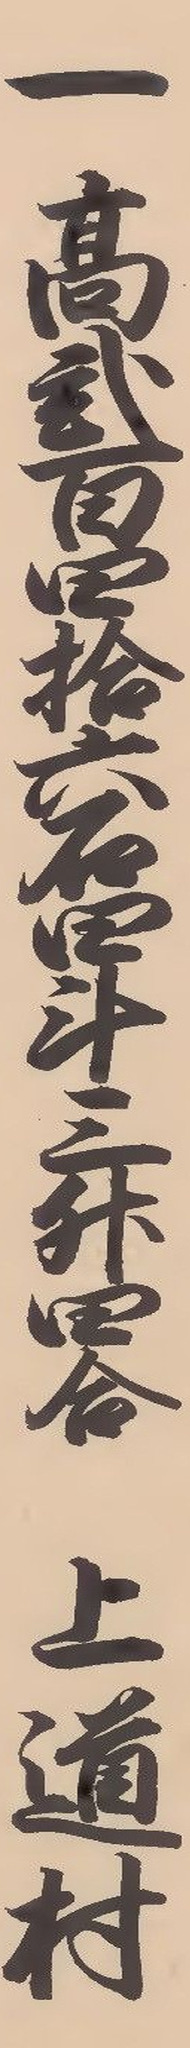一高弐百四拾六石四斗三升四合上道村
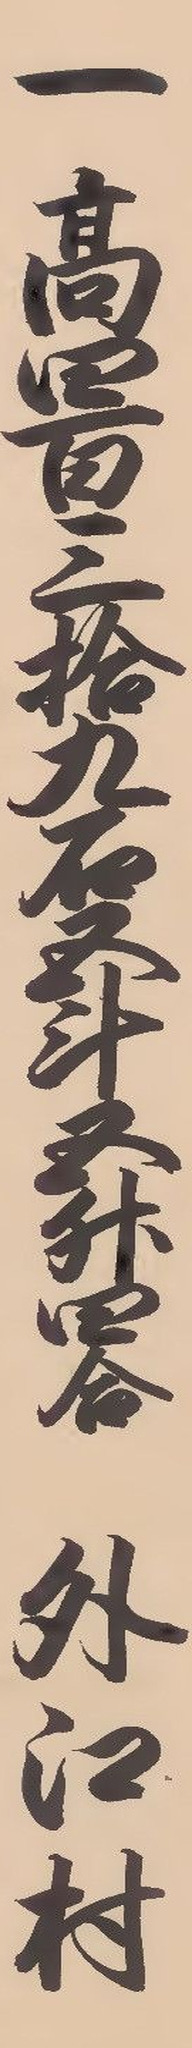一高四百三拾九石五斗五升四合外江村
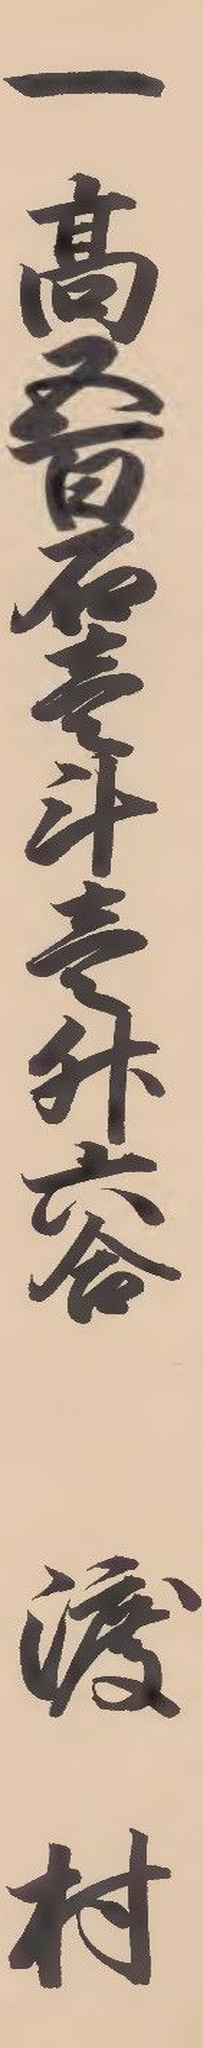一高五百石壱斗壱升六合渡村
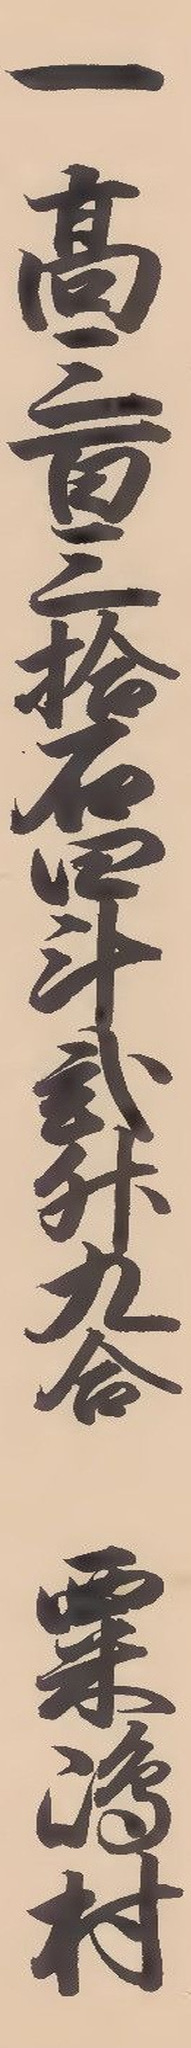一高三百三拾石四斗弐升九合粟嶋村

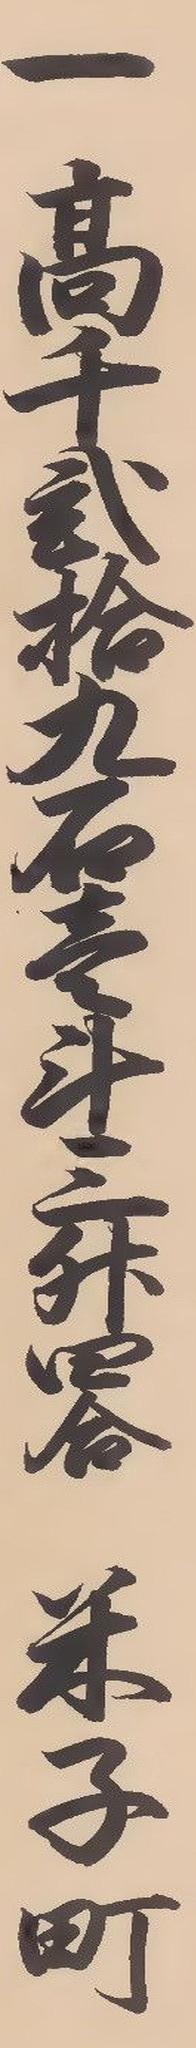一高千弐拾九石壱斗三升四合米子町
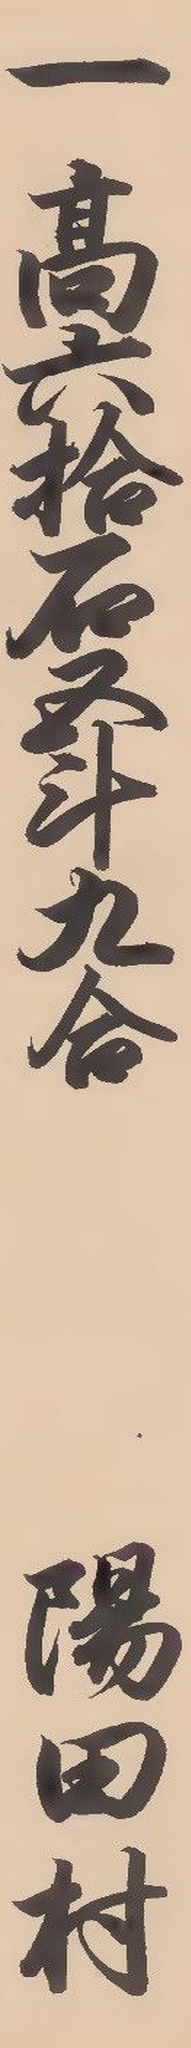一高六拾石五斗九合陽田村
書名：伯耆国郷帳
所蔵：国立公文書館 National Archives of Japan
